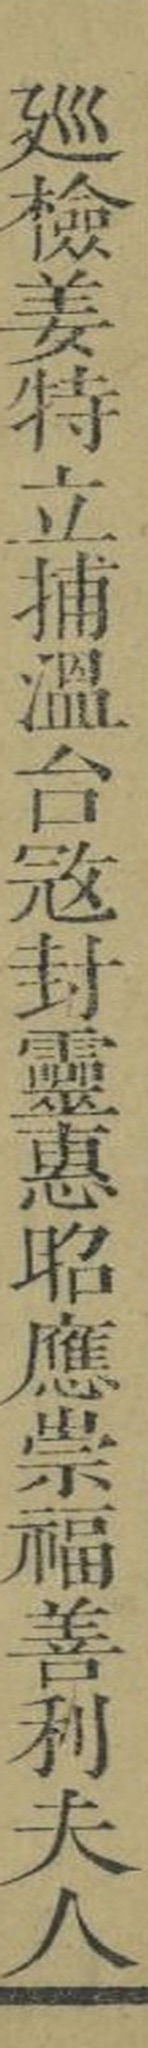廵檢姜特立捕溫台冦封靈惠昭應崇福善利夫人
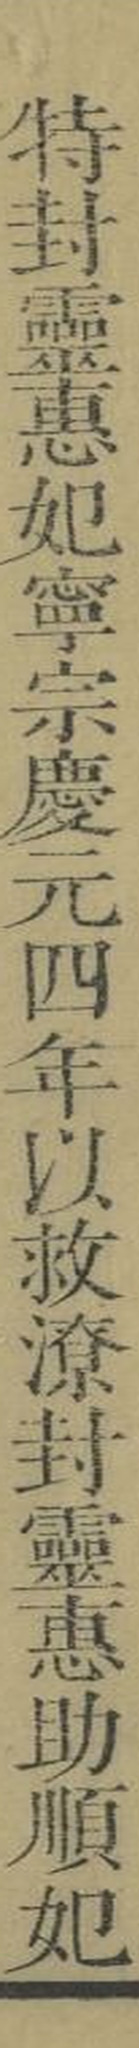特封靈惠妃寧宗慶元四年以救潦封靈惠助順妃
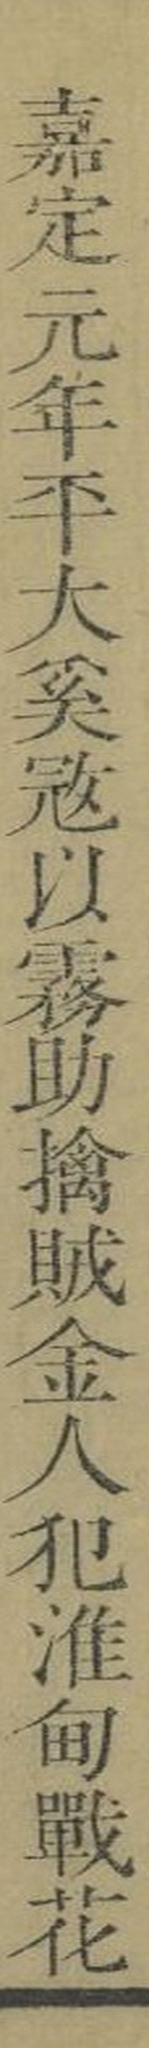嘉定元年平大奚冦以霧助擒賊金人犯淮甸戰花
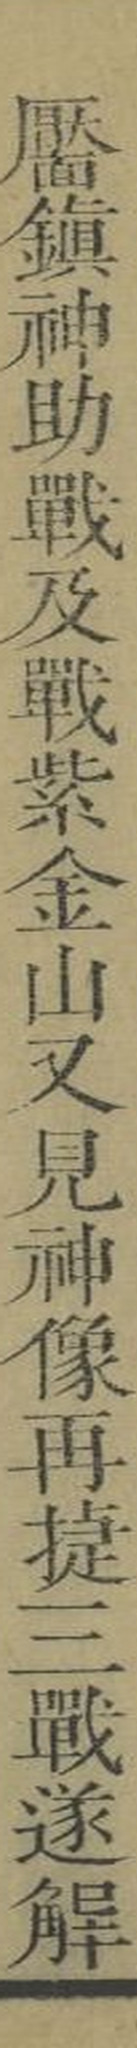靨鎭神助戰及戰紫金山又見神像再㨗三戰遂解
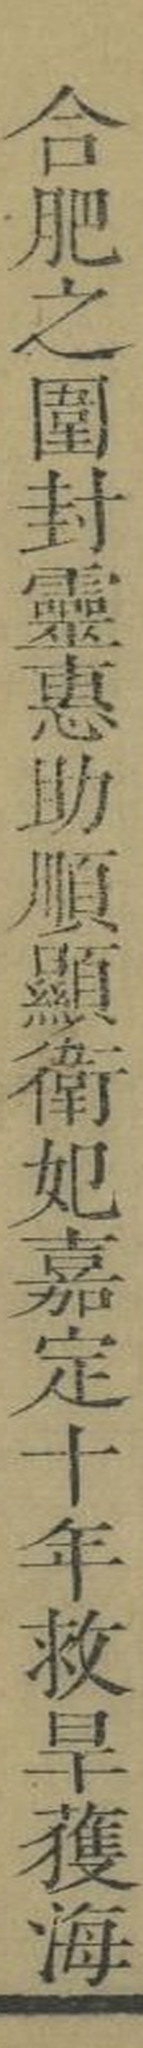合肥之圍封靈惠助順顯衛妃嘉定十年救旱獲海
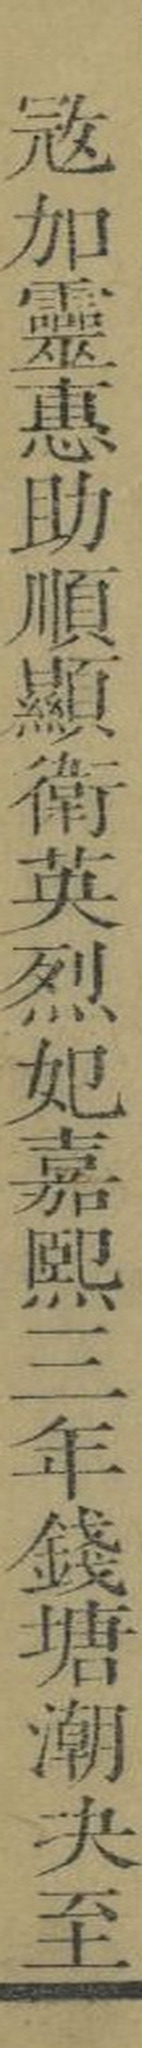冦加靈惠助順顯衛英烈妃嘉熙三年錢塘潮决至

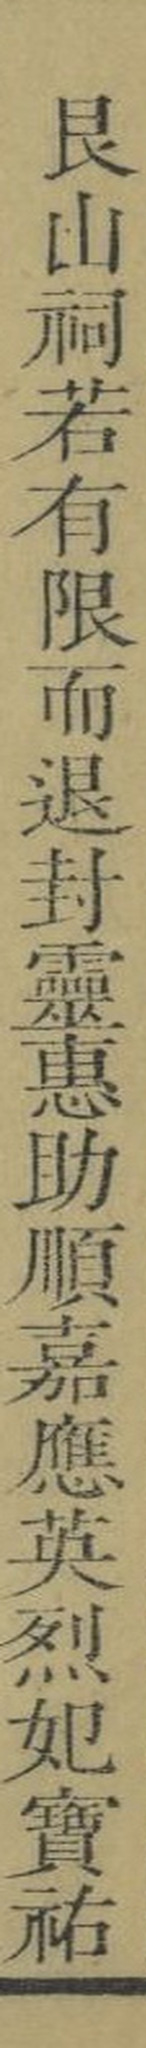艮山祠若有限而退封靈惠助順嘉應英烈妃寶祐
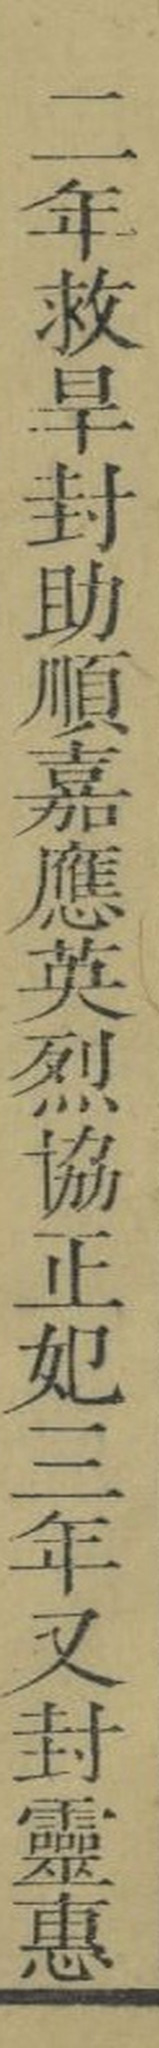二年救旱封助順嘉應英烈協正妃三年又封靈惠
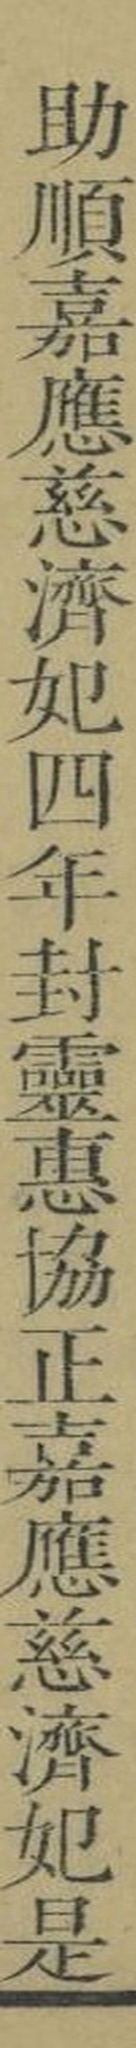助順嘉應慈濟妃四年封靈惠協正嘉應慈濟妃是
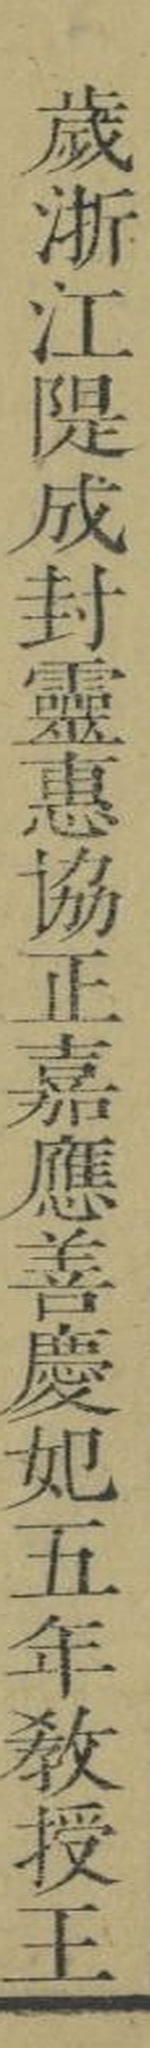歲浙江隄成封靈惠協正嘉應善慶妃五年敎授王
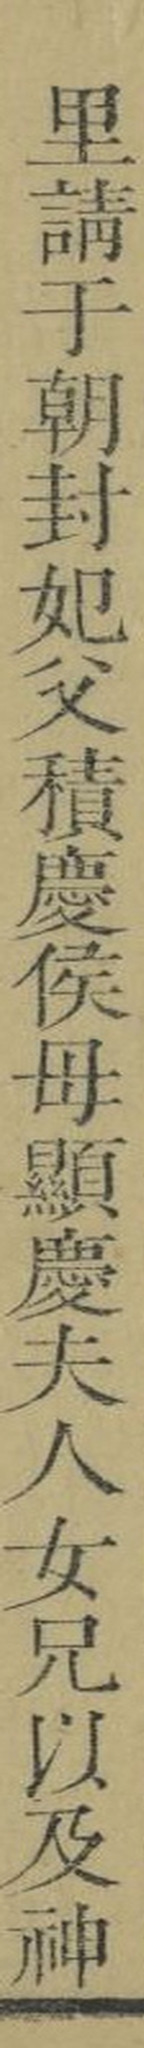里請于朝封妃父積慶侯母顯慶夫人女兄以及神
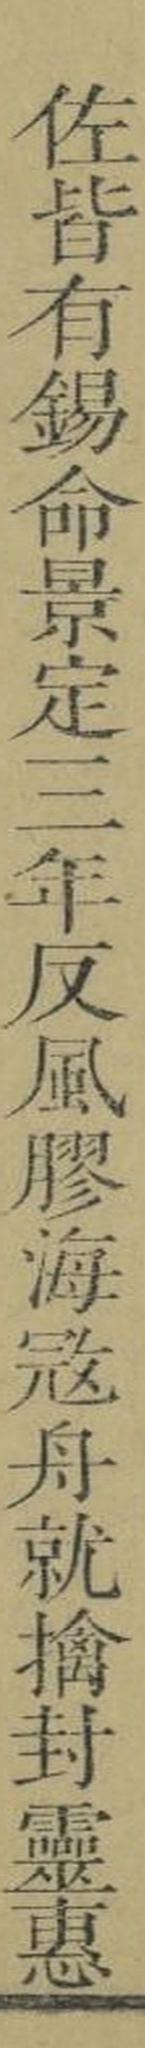佐皆有錫命景定三年反風膠海冦舟就擒封靈惠
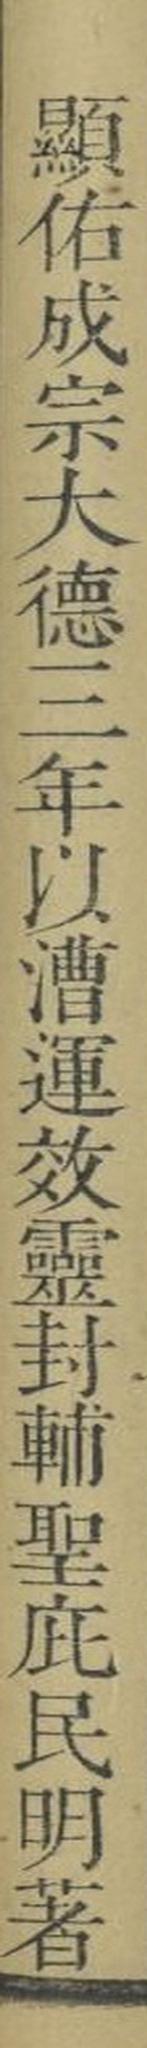顯佑成宗大德三年以漕運效靈封輔聖庇民明著
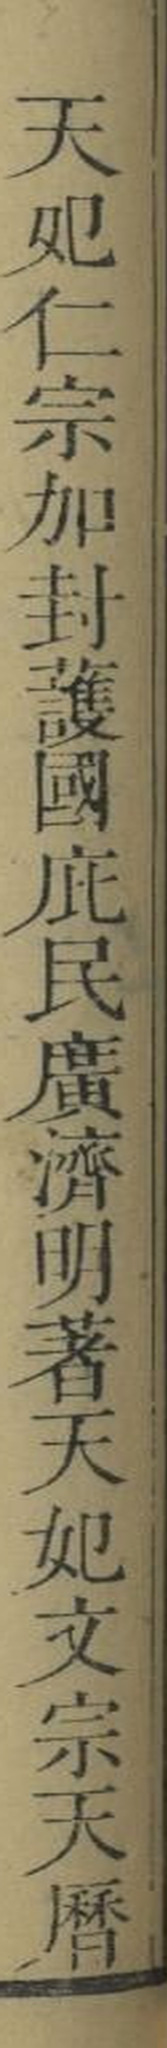天妃仁宗加封䕶國庇民廣濟明著天妃文宗天曆
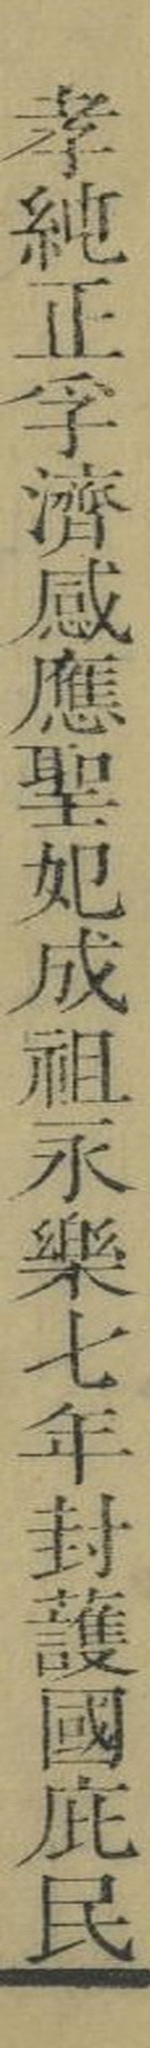孝純正孚濟感應聖妃成祖永樂七年封䕶國庇民
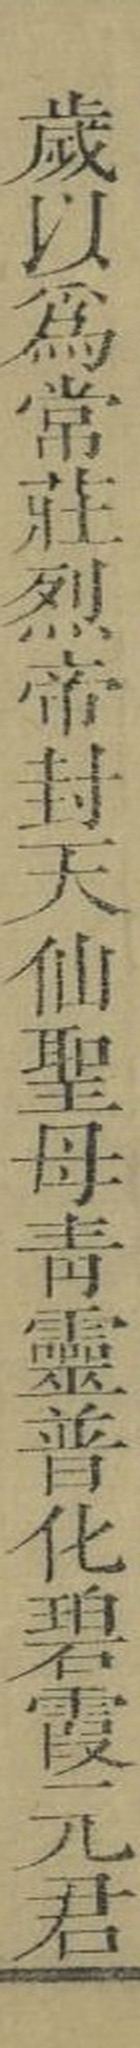歲以爲常莊烈帝封天仙聖母靑靈普化碧霞元君
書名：中山伝信録 巻一
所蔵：University of the Ryukyus Library
